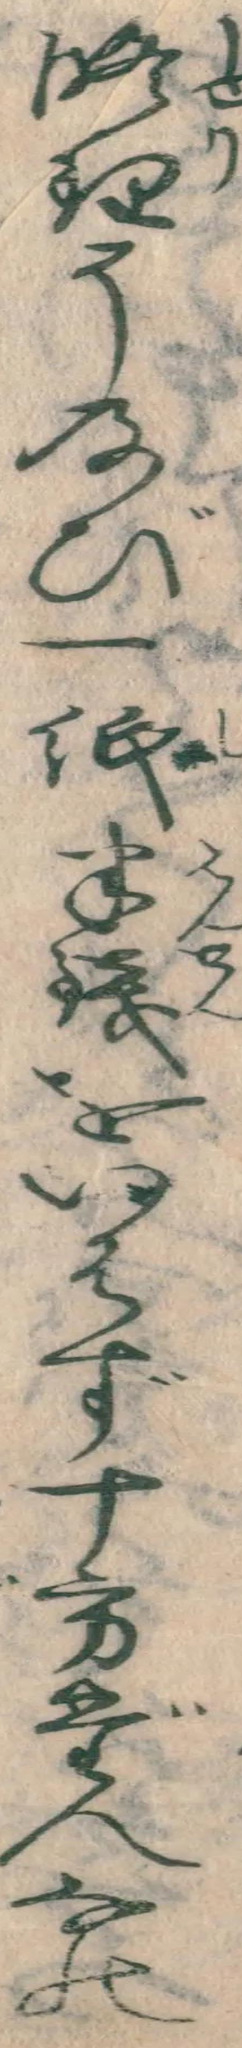修理に及び一紙半銭をいはず十方だんなの
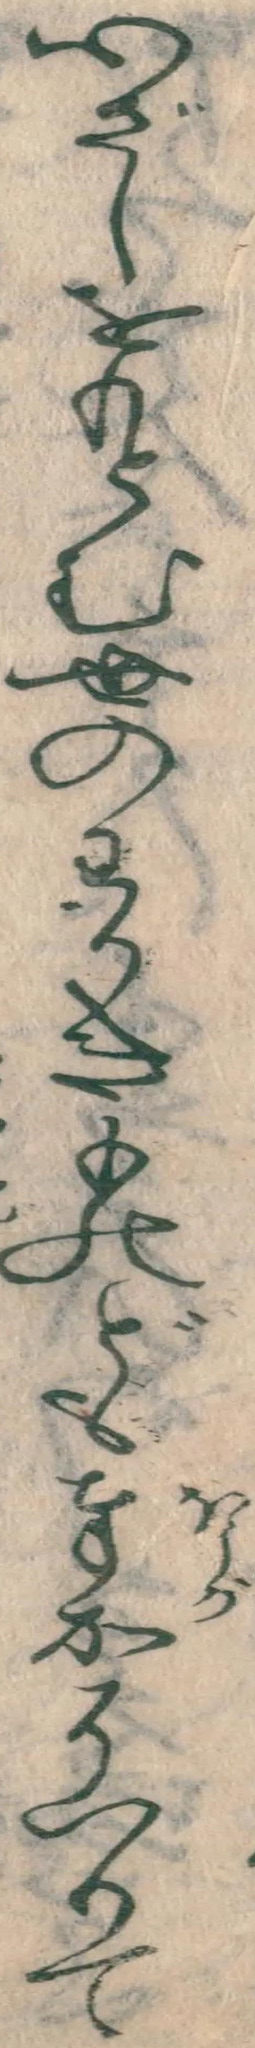心ざしをもとむ世のわかきものども奉加にいりて
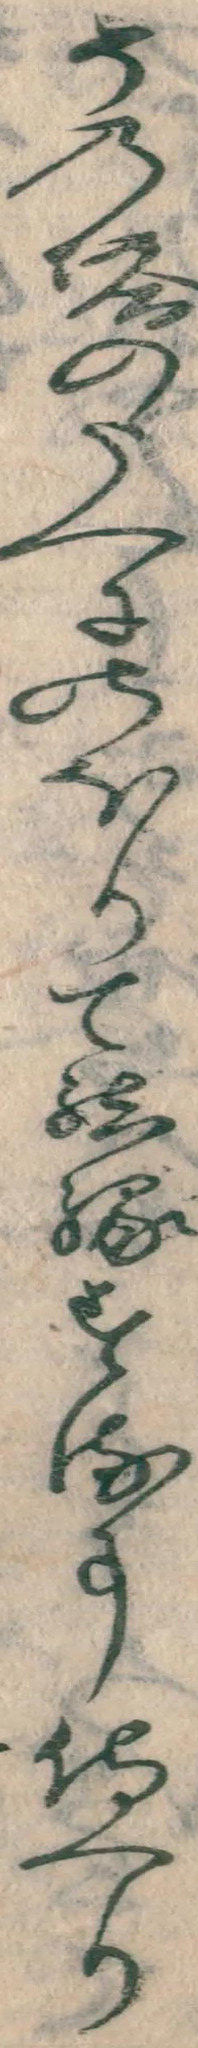その塔のうへにのぼりて結縁する事侍へり
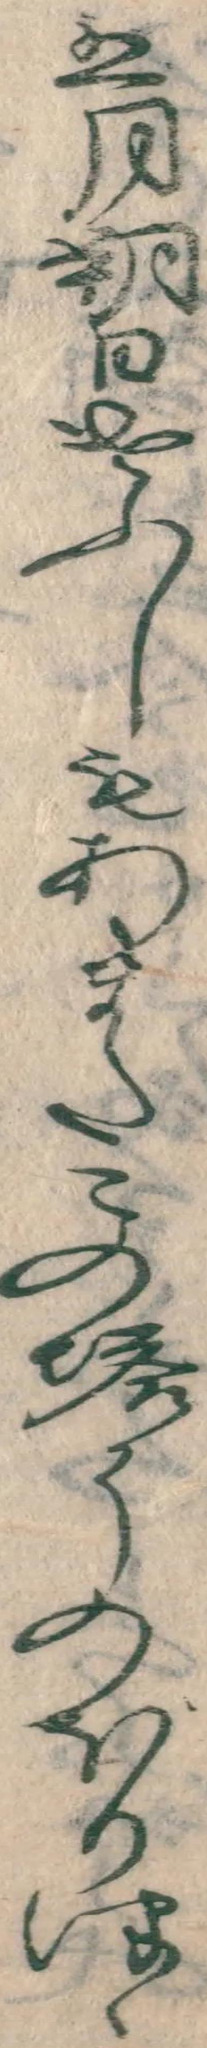五月朔日けふしもあまたこの塔にのほりつゝ
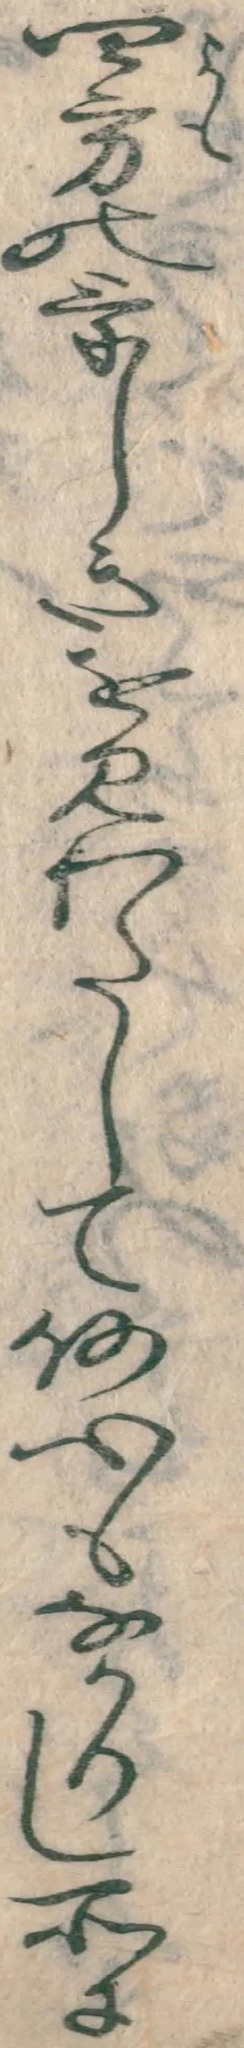四方のけしきを見わたして何心もなかりし所に
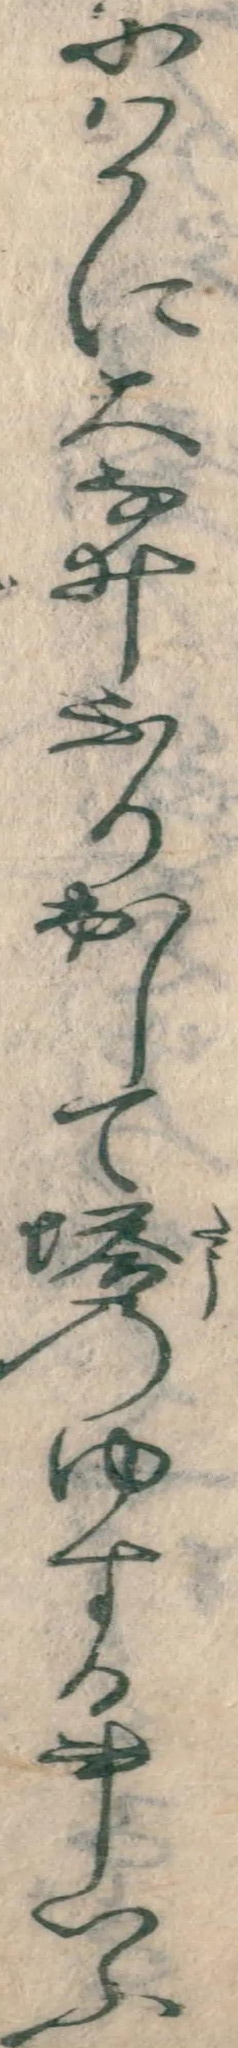にはかに大なゐふり出して塔のゆすること事いふ
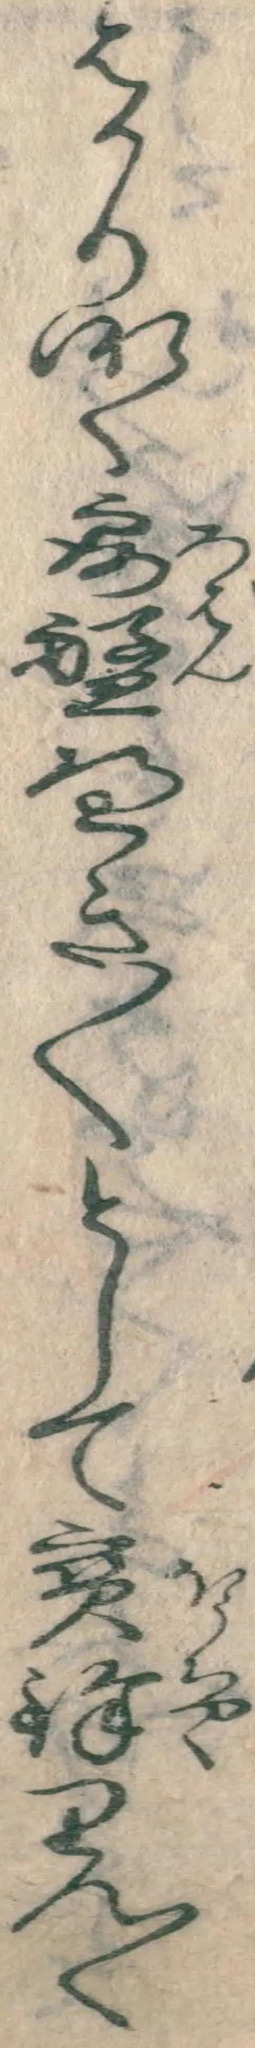はかりなく路盤へき〳〵として寶鐸りん〳〵
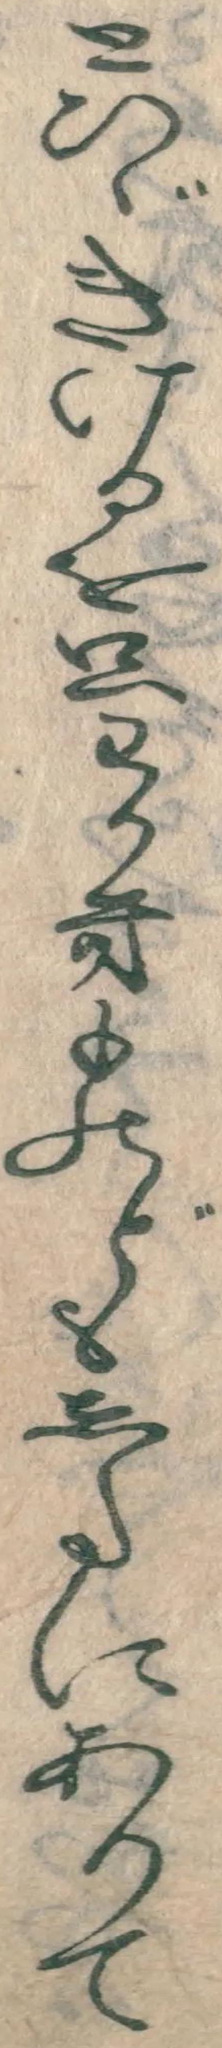とひゞきけるを只わかきものどもしたにありて
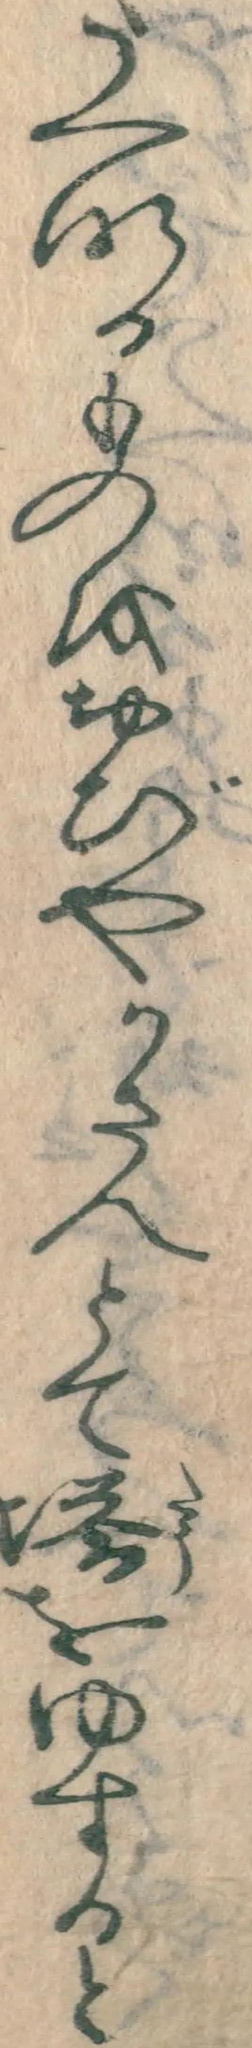うへなるものをおびやかさんとて塔をゆすると

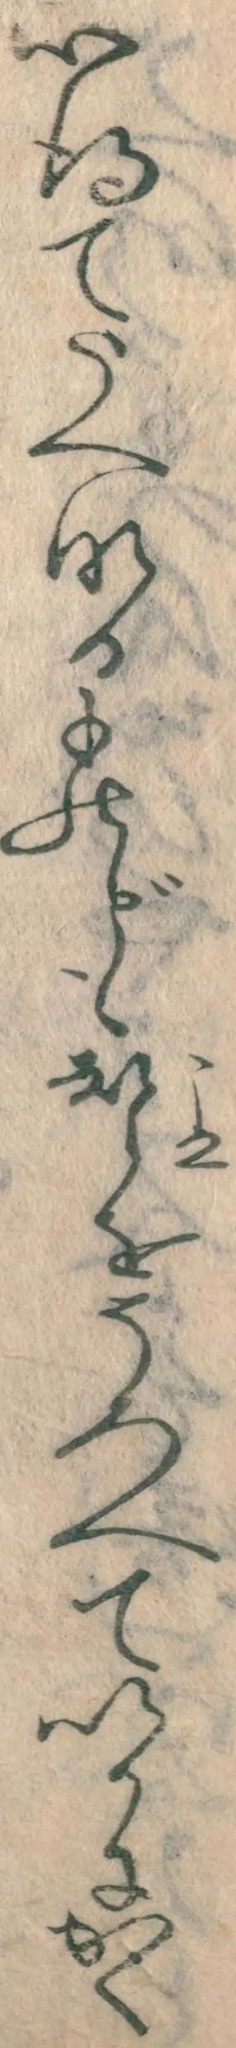心持てうへなるものども聲をそろへていかにかく
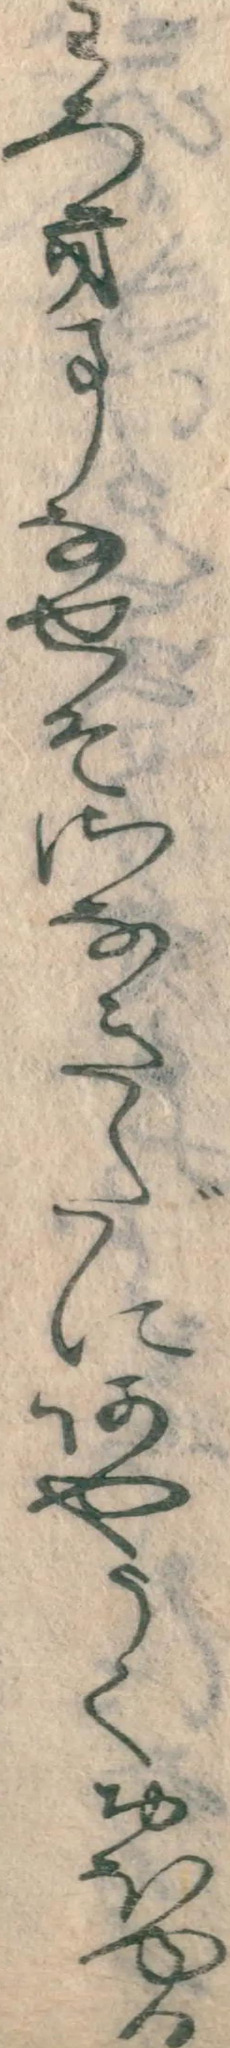わろき事なせそさなきだにあやうくおほゆる
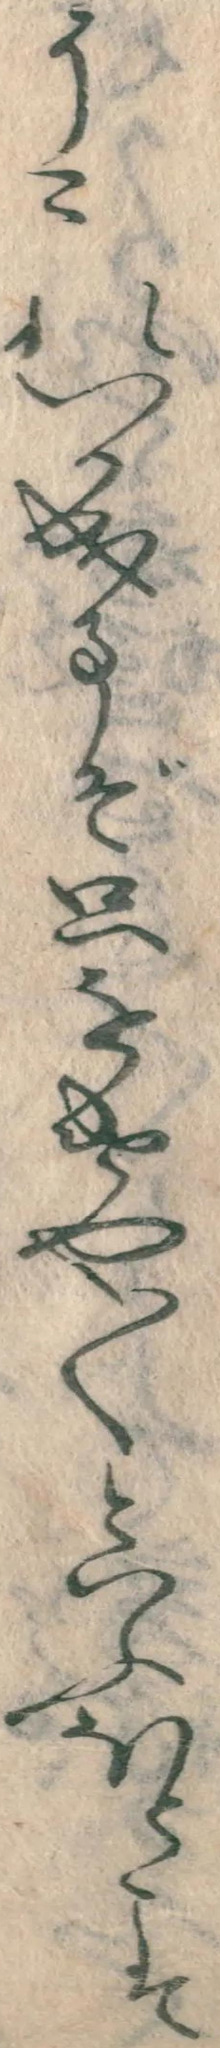にこれいか成事ぞ只をけや〳〵といふほとこは
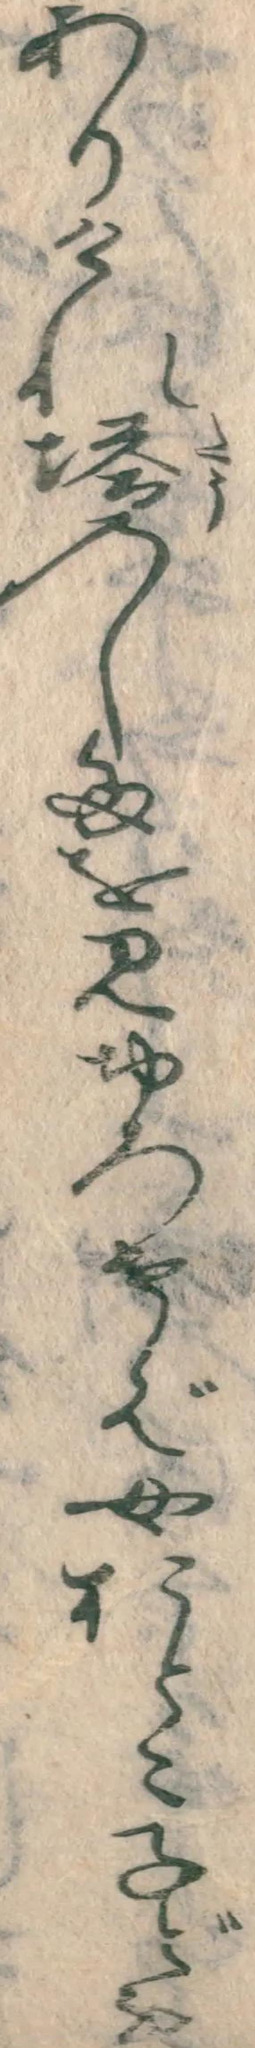ありけれ塔のしたを見おろせば女おとこ子ども
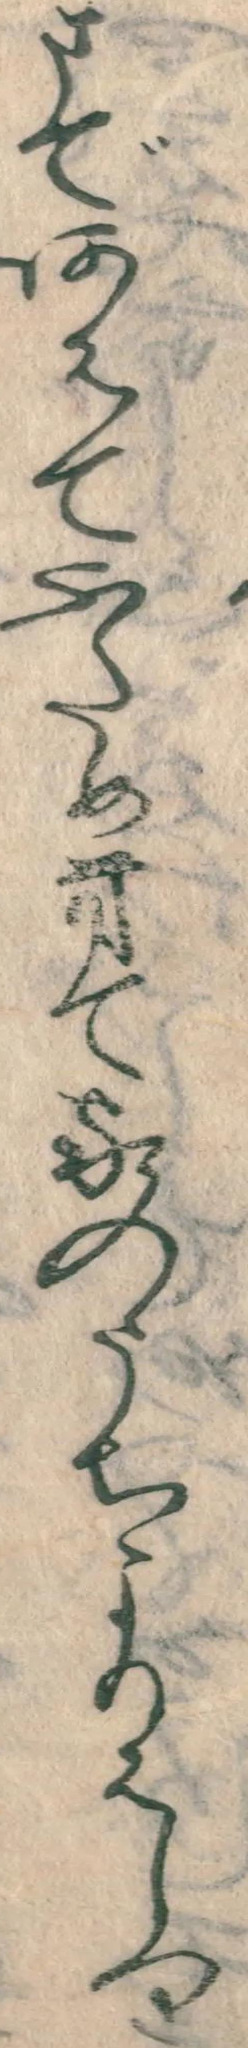まであはてふためきて家のうちよりはしり
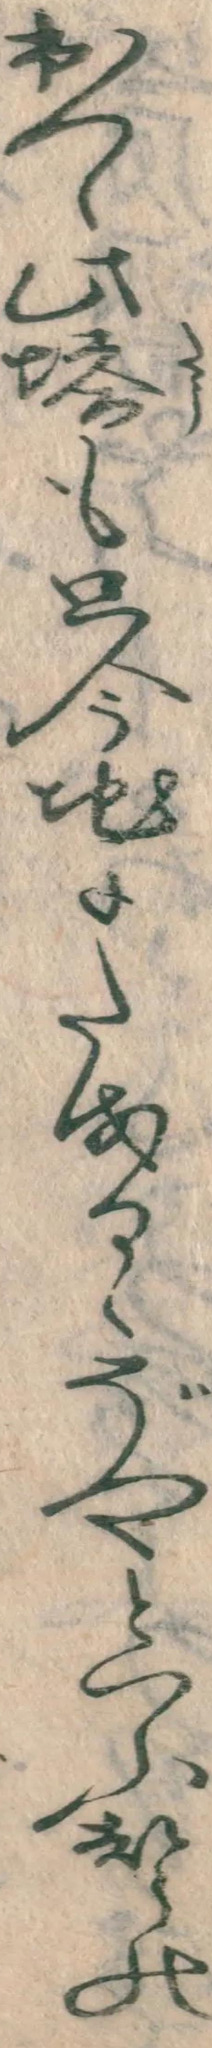出つゝ此塔も只今地にたをるゝぞやといふ聲の
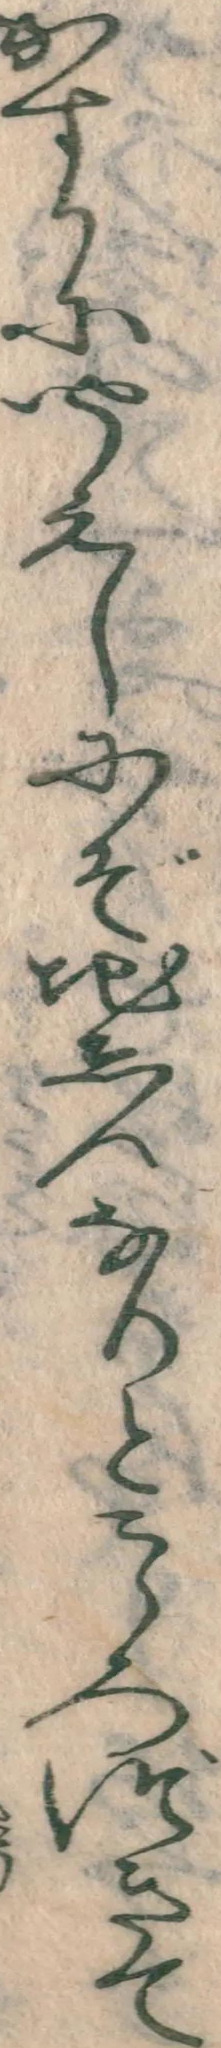かすかに聞えしにぞ地しんなりとこころづきて
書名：艱難目異志. 上,下
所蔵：国立国会図書館 National Diet Library, JAPAN
